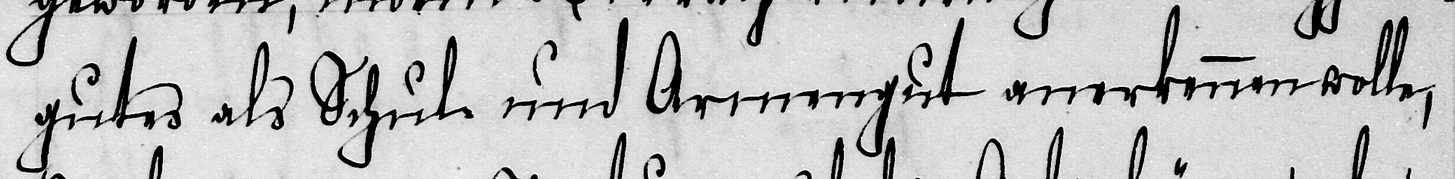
gutes als Schul- und Armengut anerkennen wolle,
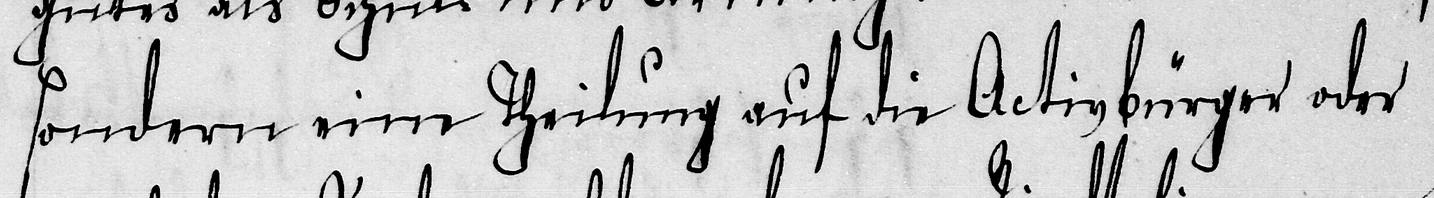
sondern eine Theilung auf die Activbürger oder
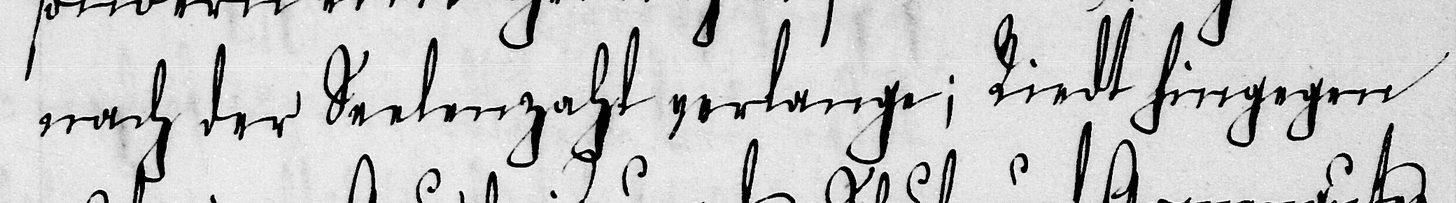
nach der Seelenzahl verlange; Riedt hingegen
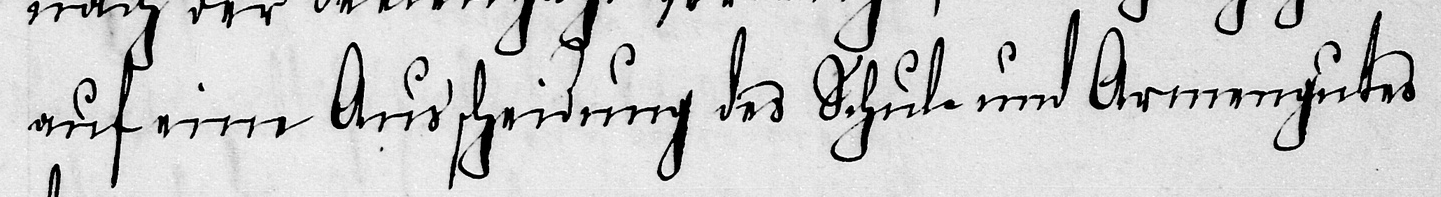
auf eine Ausscheidung des Schul- und Armengutes
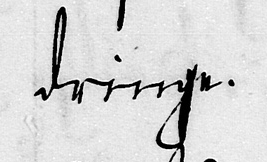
dringe.
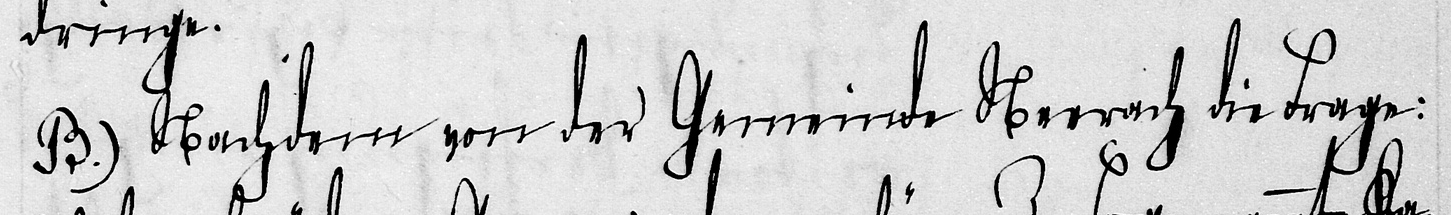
B.) Nachdem von der Gemeinde Neerach die Frage:
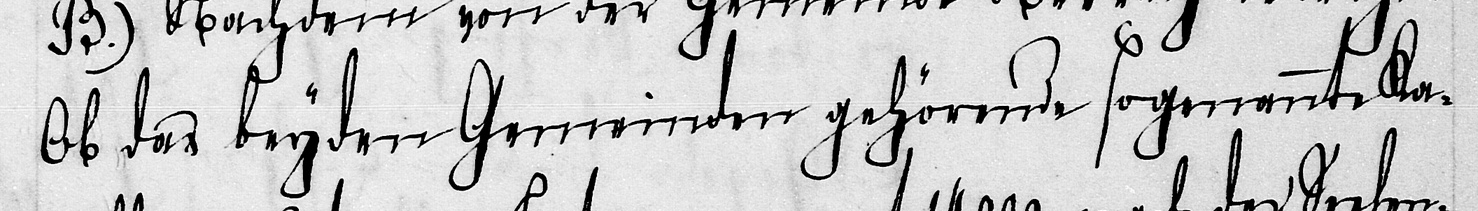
Ob das beyden Gemeinden gehörende sogenannte Ka¬
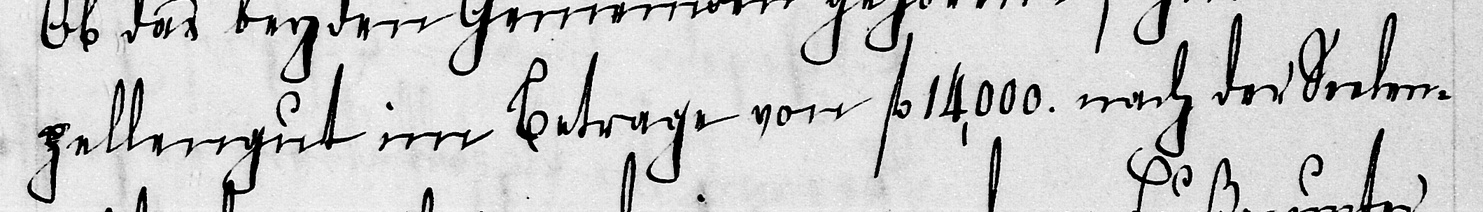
pellengut im Betrage von fl. 14,000. nach der Seelen¬
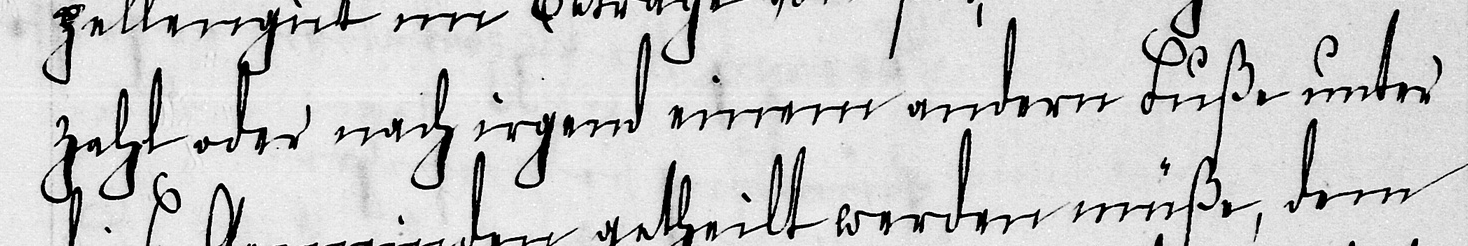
zahl oder nach irgend einem andern Fuße unter
